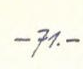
71
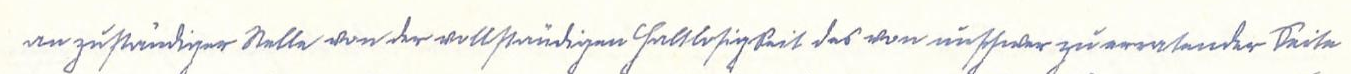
an zuständiger Stelle von der vollständige Haltlosigkeit des von unschwer zu erratender Seite
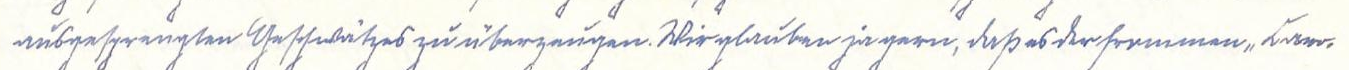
ausgesprengten Geschwätzes zu überzeugen. Wir glauben ja gern, dass es der frommen „Caro-
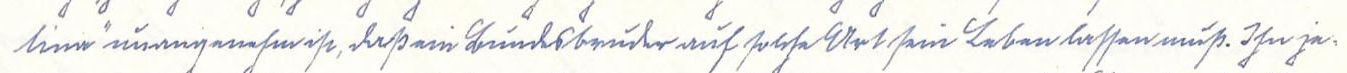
lina“ unangenehm ist, dass ein Bundesbruder auf solche Art sein Leben lassen muß. Ihn je-
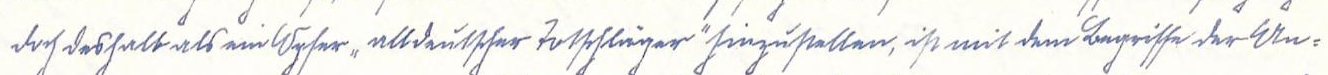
doch deshalb als ein Opfer „alldeutscher Totschläger“ hinzustellen, ist mit dem Begriffe der An-
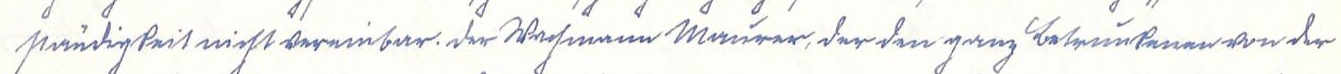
ständigkeit nicht vereinbar. Der Wachmann Maurer, der den ganz Betrunkenen von der
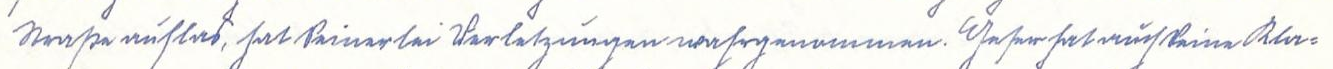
Straße auflas, hat keinerlei Verletzungen wahrgenommen. Geser hat auch keine Kla-
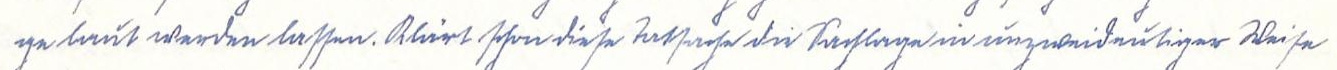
ge laut werden lassen. Klärt schon diese Tatsache die Sachlage im unzweideutige Weise
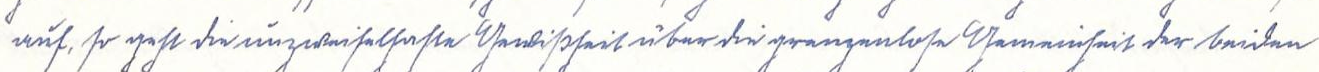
auf, so geht die unzweifelhafte Gewissheit über die grenzenlose Gemeinheit der beiden
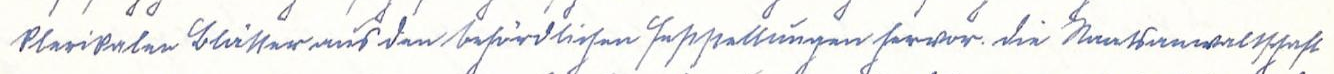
klerikalen Blätter aus den behördlichen Feststellungen hervor, die Staatsanwaltschaft
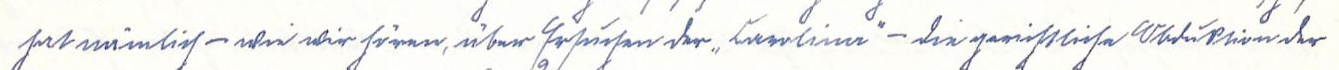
hat nämlich - wie wir hören, über Ersuchen der „Carolina“ -die gerichtliche Obduktion der
